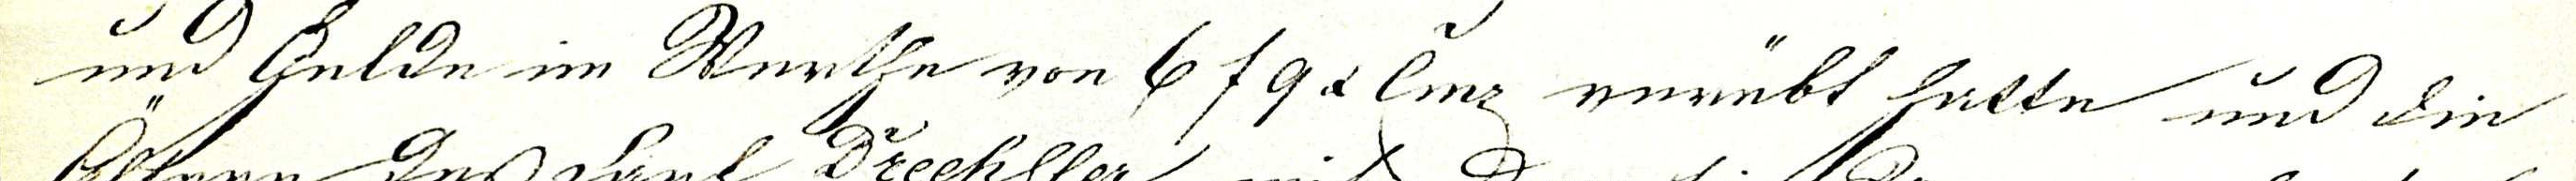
und Gelde im Werthe von 6f 9x Cmz verübt hatte und die
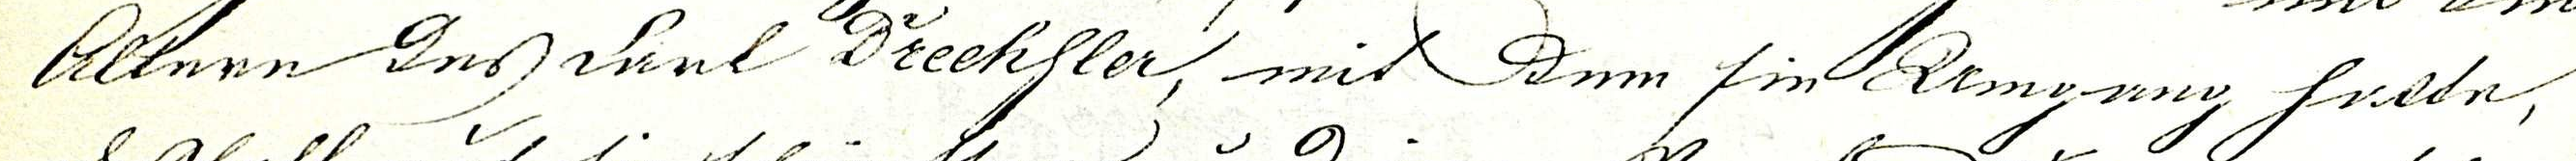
Ältern des Carl Drechsler, mit dem sie Umgang hatte,
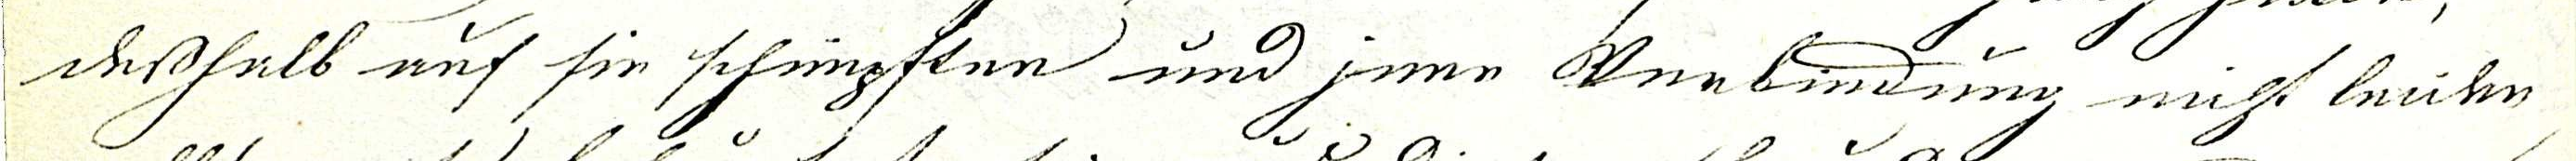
deshalb auf sie schimpften und jene Verbindung nicht leiden
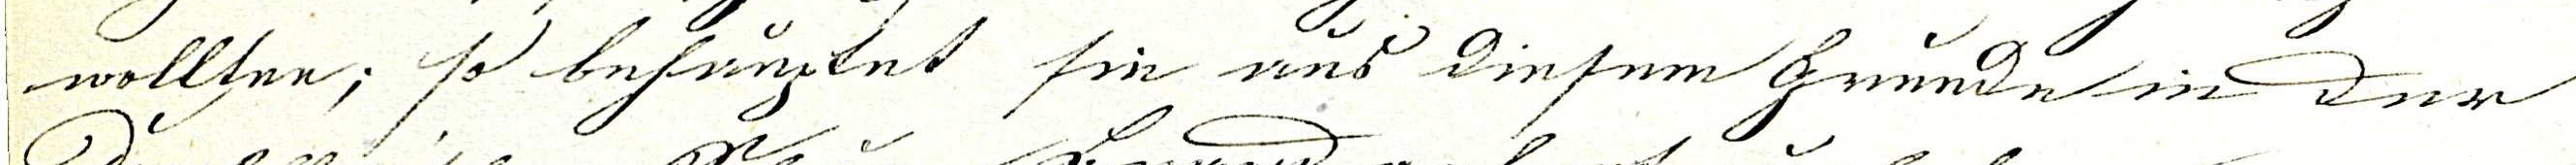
wollten, so behauptet sie aus diesem Grunde in der
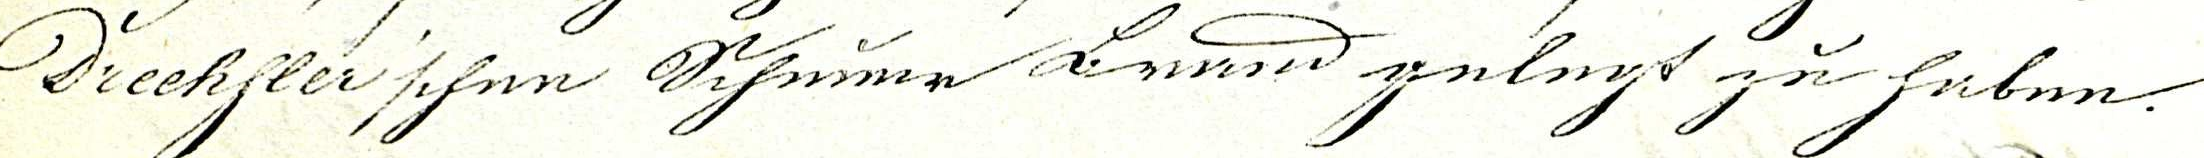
Drechsler’schen Scheuer [barn] Brand gelegt zu haben.
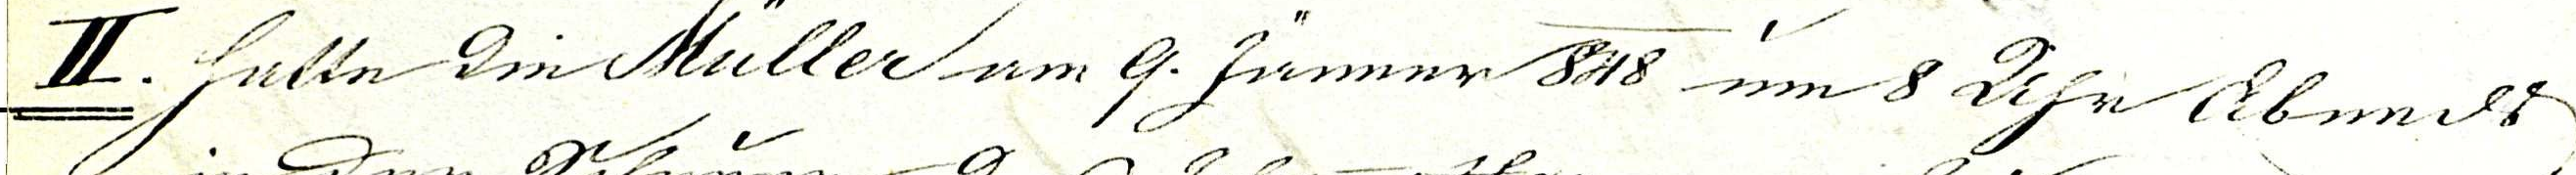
II. hatte die Müller am 9. Jänner [1]848 um 8 Uhr Abends
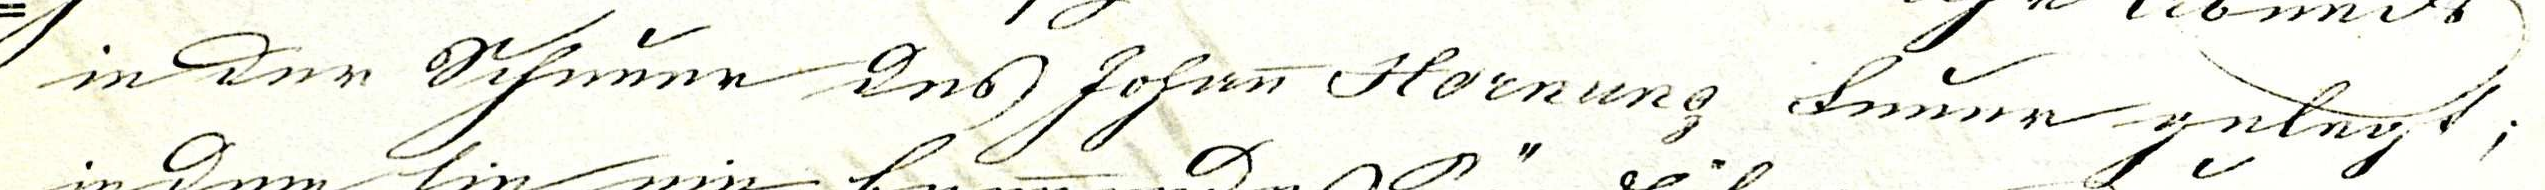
in der Scheuer des Johann Hornung Feuer gelegt;
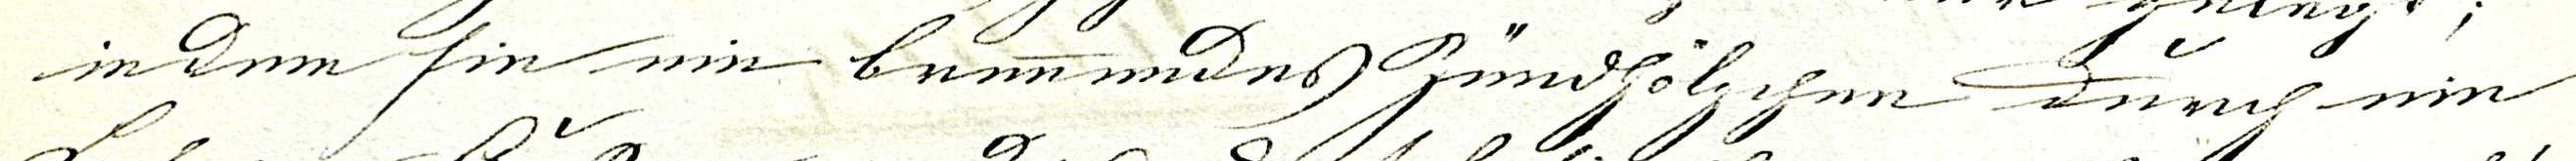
in dem sie ein brennendes Zündhölzchen durch ein
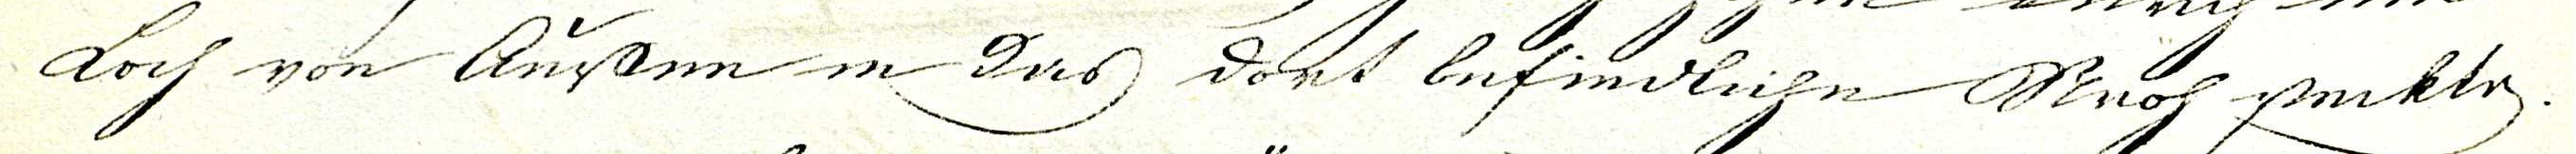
Loch von Außen in das dort befindliche Stroh steckte.
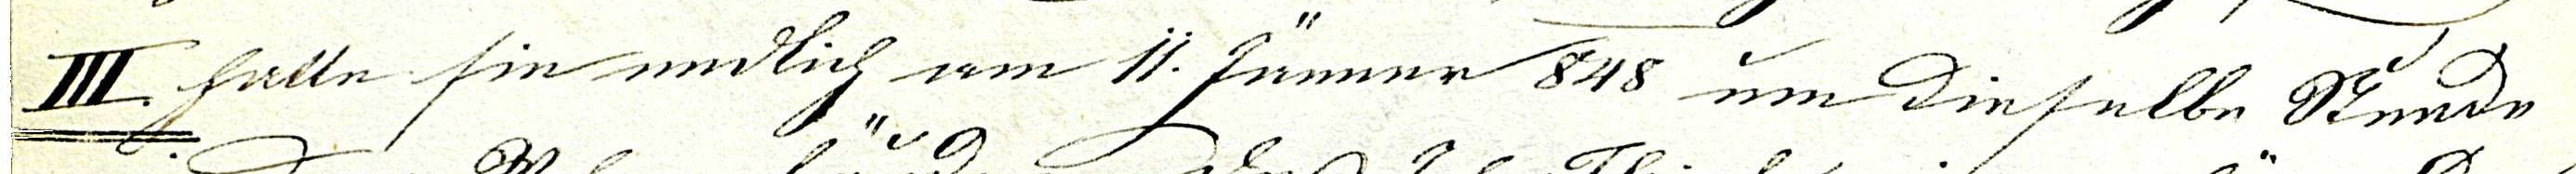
III. hatte sie endlich am 11. Jänner 848 um dieselbe Stunde
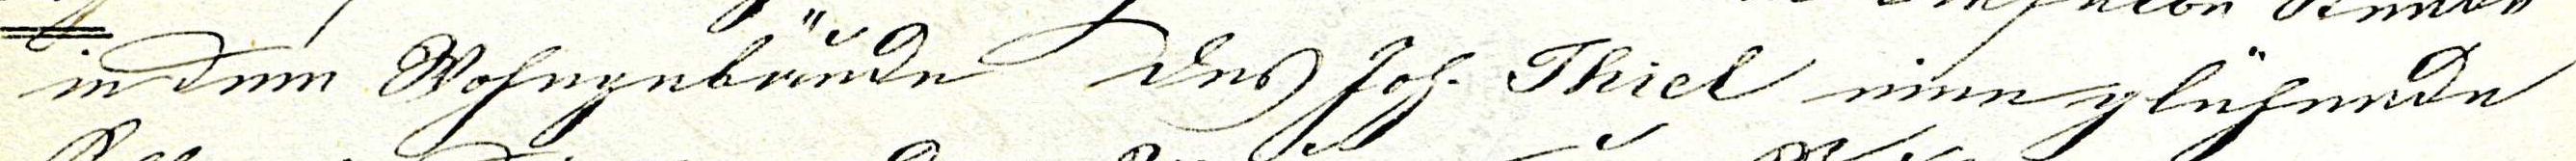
in dem Wohnbegäude des Joh. Theil eine glühende
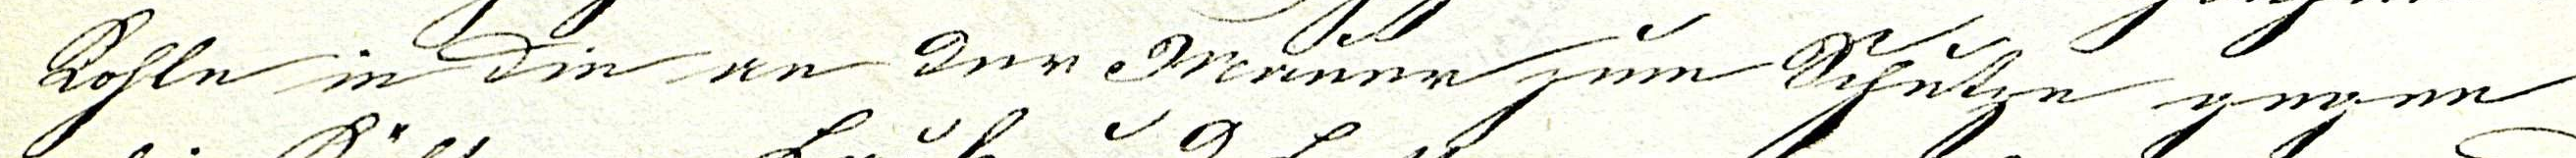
Kohle in die an der Mauer zum Schutze gegen
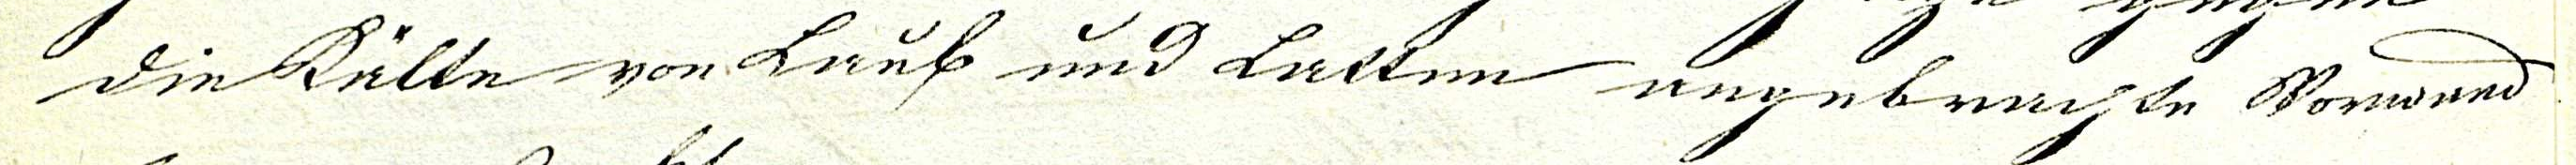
die Kälte von Laub und Latten angebrachte Vorwand
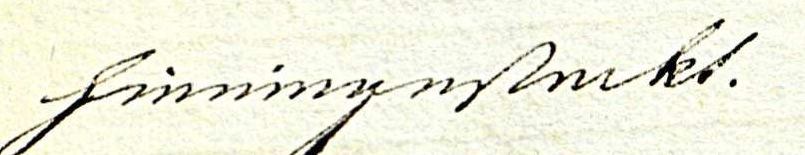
hineingesteckt.
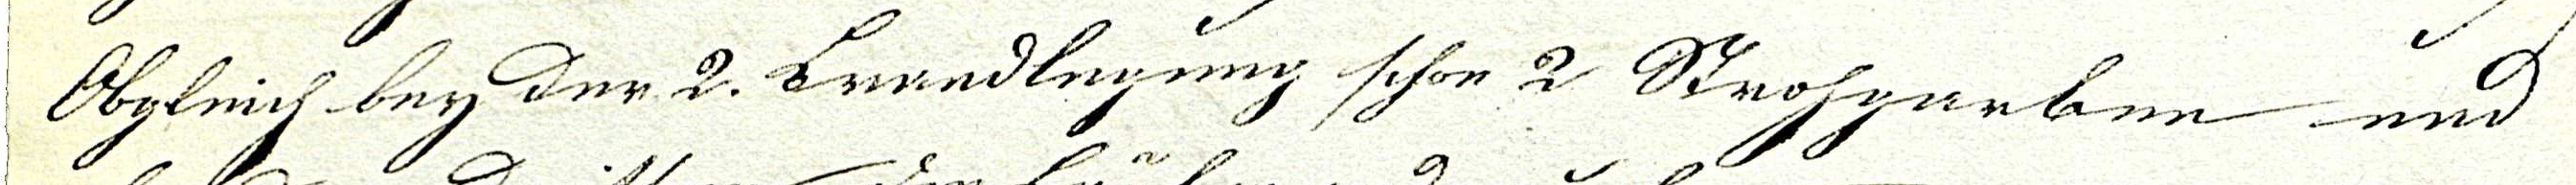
Obleicht bey der 2. Brandlegung schon 2 Strohgarben und
